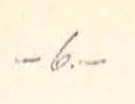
6.
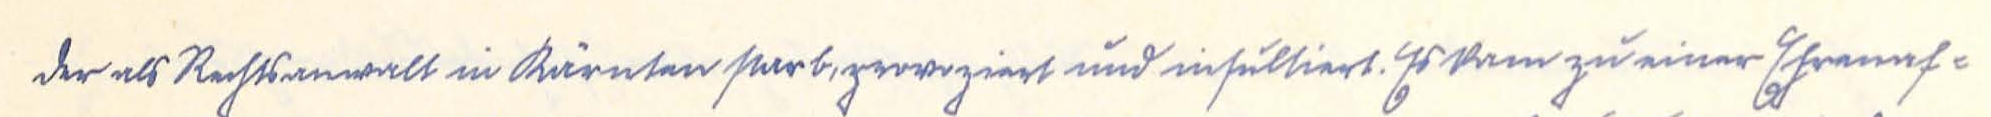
der als Rechtsanwalt in Kärnten starb, provoziert und insultiert. Es kam zu einer Ehrenaf-
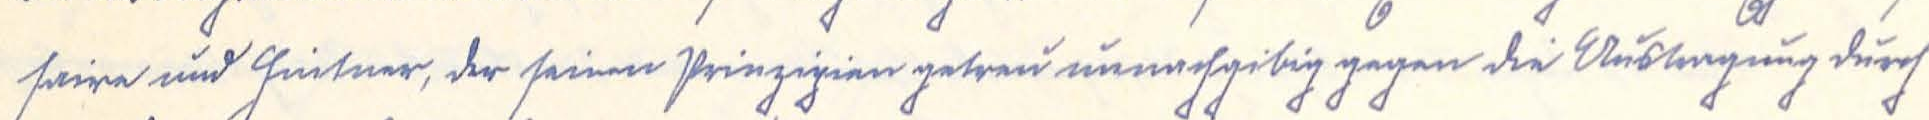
faire und Hintner, der seinen Prinzipien getreu unnachgibig gegen die Austragung durch
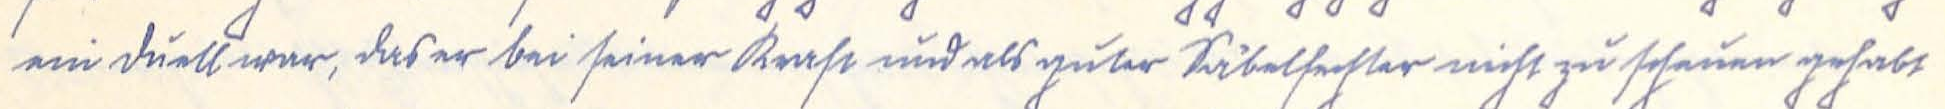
ein Duell war, das er bei seiner Kraft und als guter Säbelfechter nicht zu scheuen gehabt
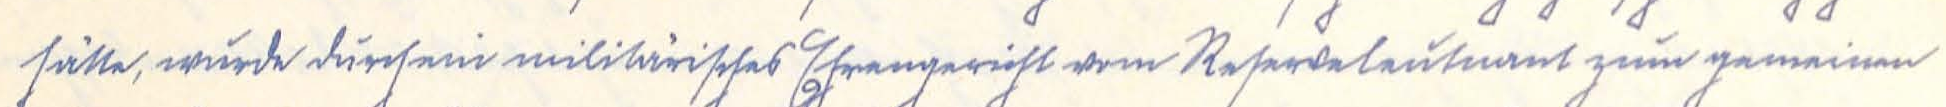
hätte, wurde durch ein militärisches Ehrengericht vom Reserveleutnant zum gemeinen
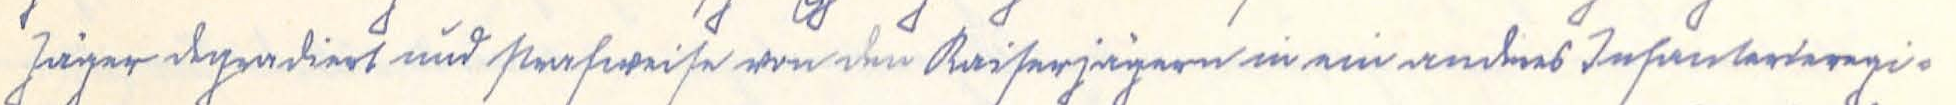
Jäger degradiert und strafweise von den Kaiserjägern in ein anderes Infanterieregi-
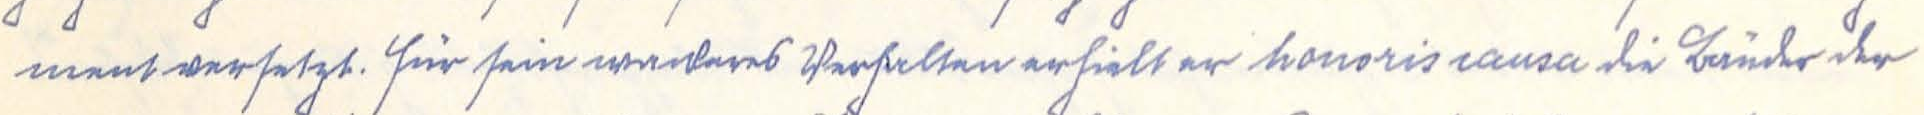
ment versetzt. Für sein wackeres Verhalten erhielt er honoris causa die Bänder der
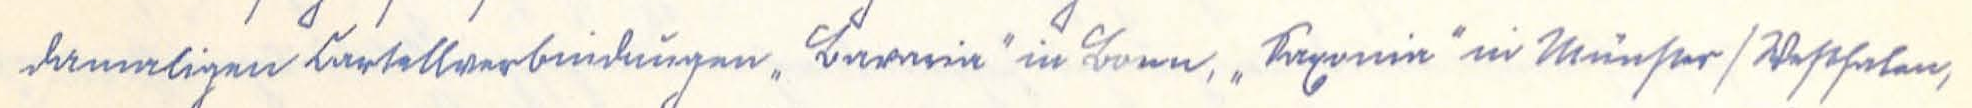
damaligen Cartellverbindungen "Bavaria" in Bonn, "Saxonia" in Münster / Westfalen,
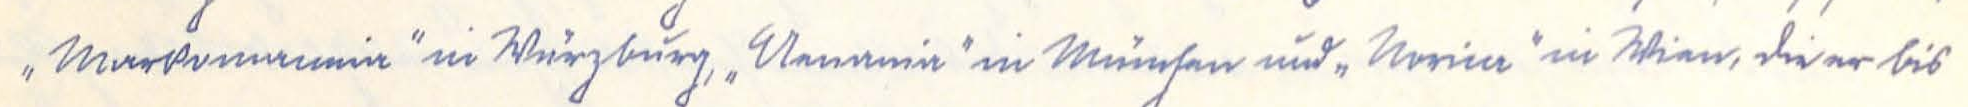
"Markomannia" in Würzburg, "Aenania" in München und "Norica" in Wien, die er bis
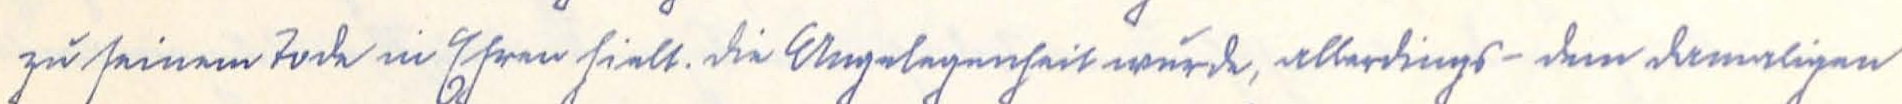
zu seinem Tode in Ehren hielt. Die Angelegenheit wurde, allerdings- dem damaligen
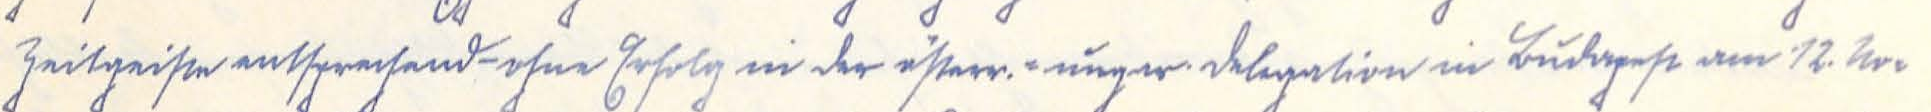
Zeitgeiste entsprechend- ohne Erdolg in der österr.-ungar. Delegation in Budapest am 12. No-
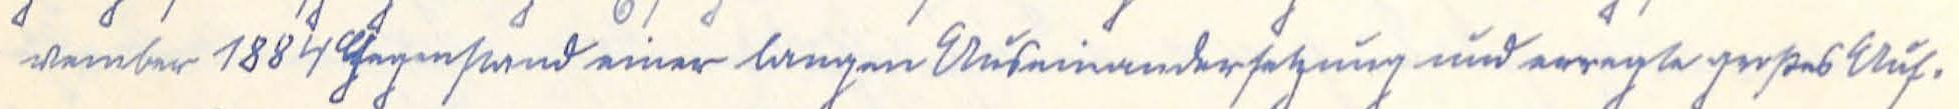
vember 1884 Gegenstand einer langen Auseinandersetzung und erregte großes Auf-
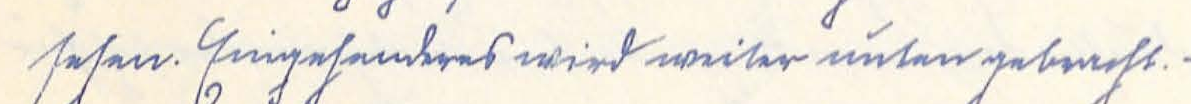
sehen. Eingehenderes wird weiter unten gebracht.
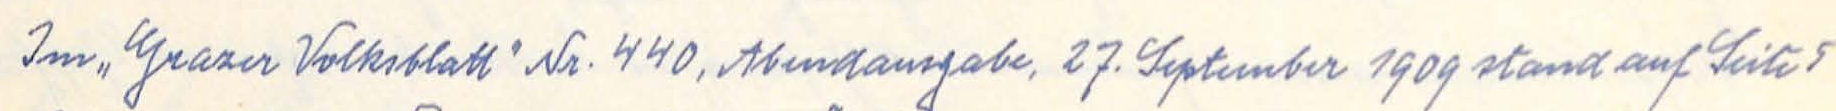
Im "Grazer Volksblatt" Nr. 440, Abendausgabe, 27. September 1909 stand auf Seite 5
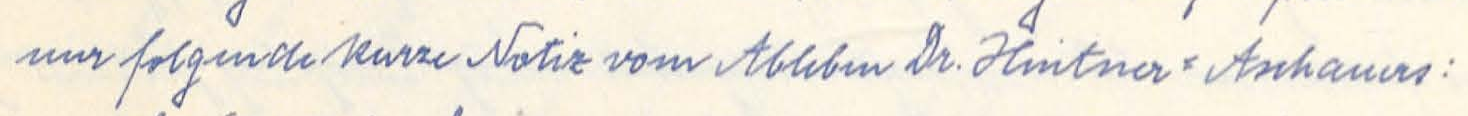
nur folgende kurze Notiz vom Ableben Dr. Hintner-Aschauers:
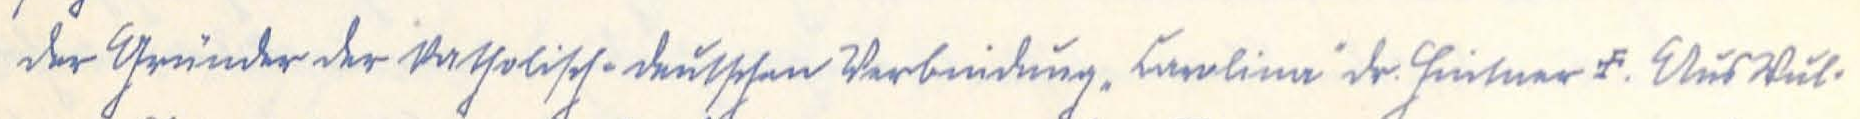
Der Gründer der katholisch-deutschen Verbindung "Carolina" Dr. Hintner F. Aus Wul-
